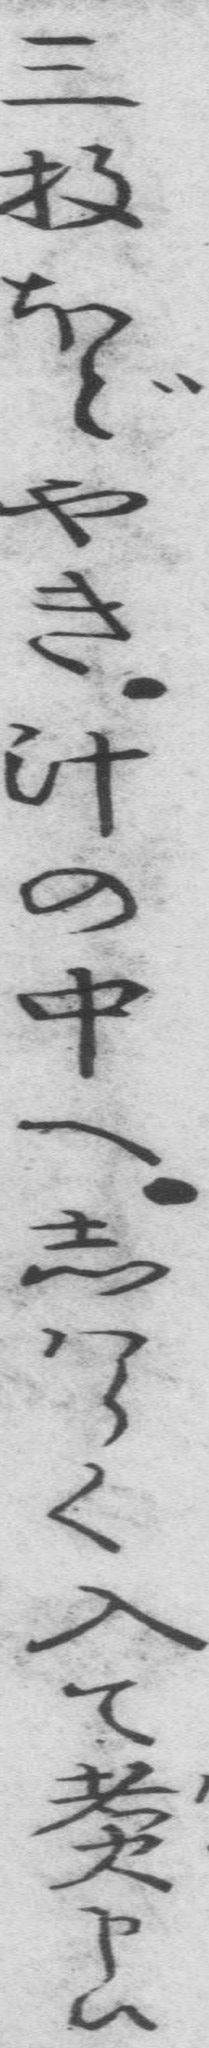三枚ほどやき。汁の中へ。しはらく入て煮申候

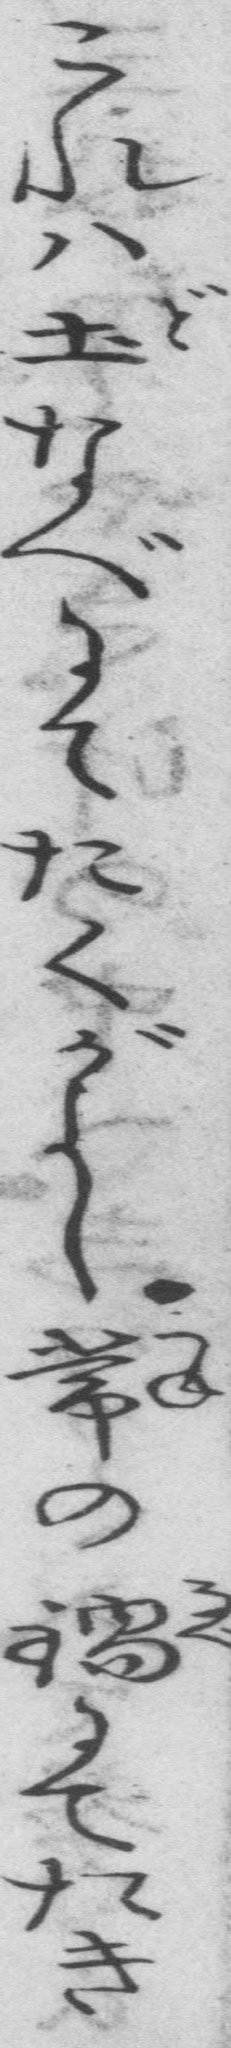これは土なべにてたくがよし。常の鍋にてたき
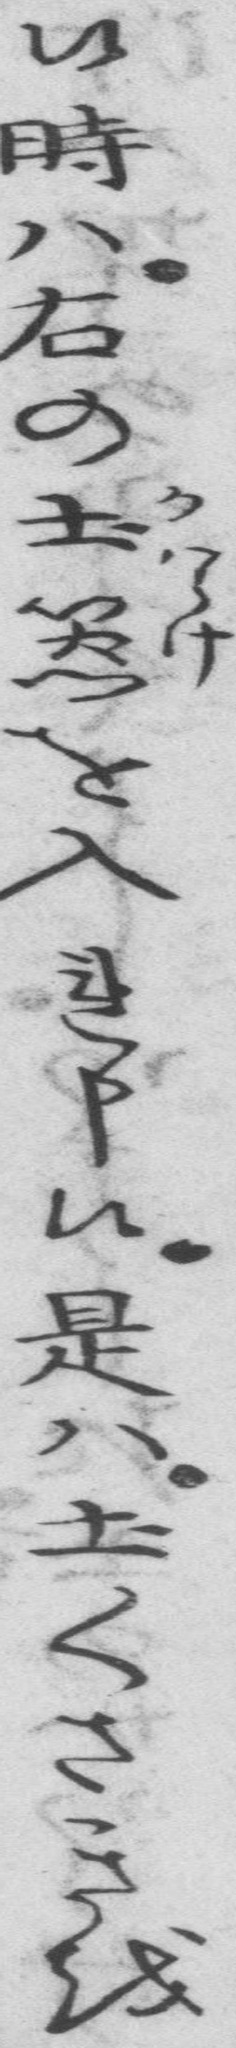候時は。右の土器を入れ申候。是は。土くさきを
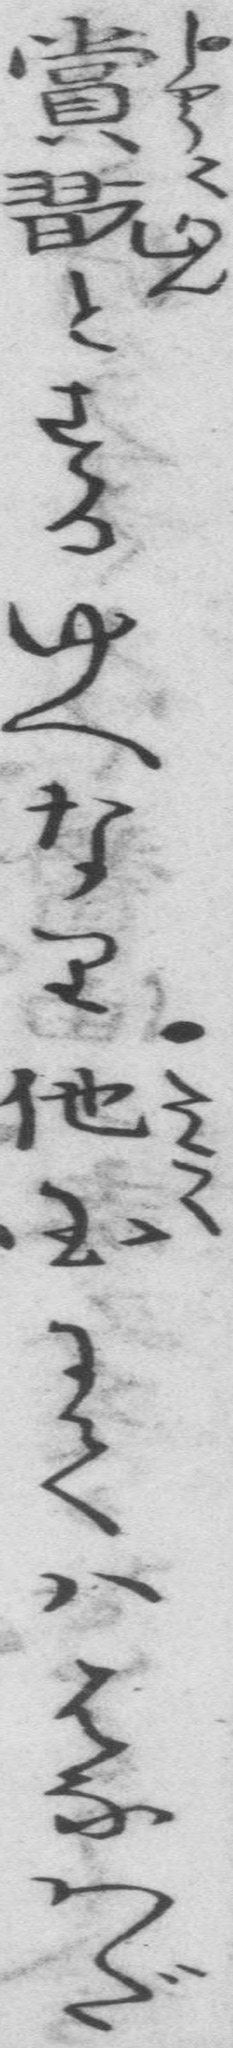賞翫とするゆへなり。他国にてははなはだ
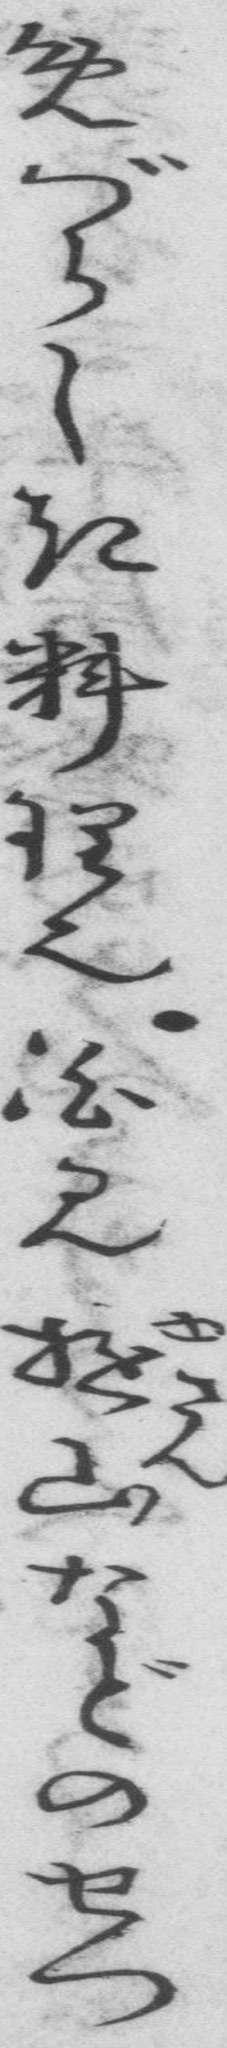めづらしき料理也。花見遊山などのせつ
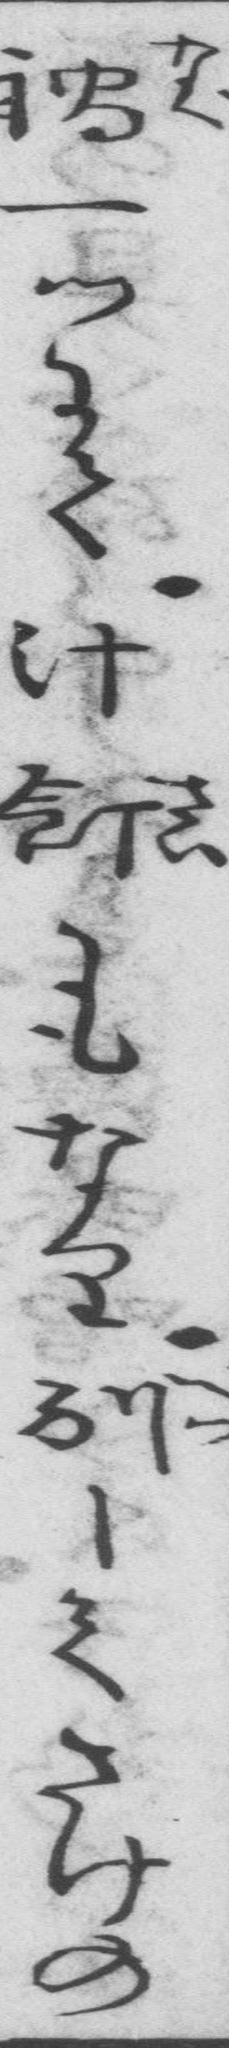鍋一ツにて。汁飣にもなり。別してさけの
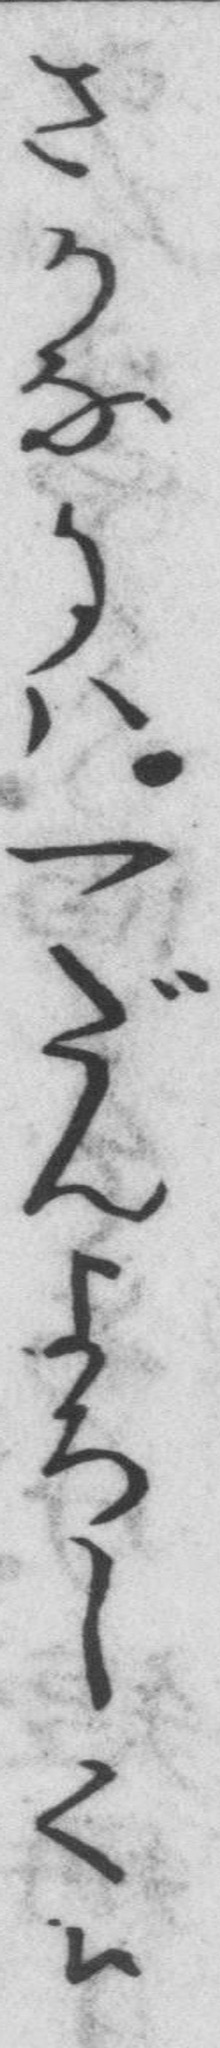さかなには。一だんよろしく候
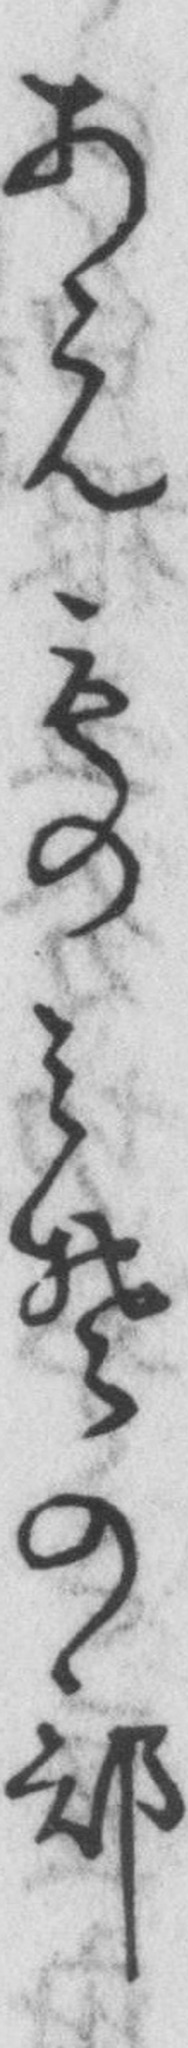あえものみその部
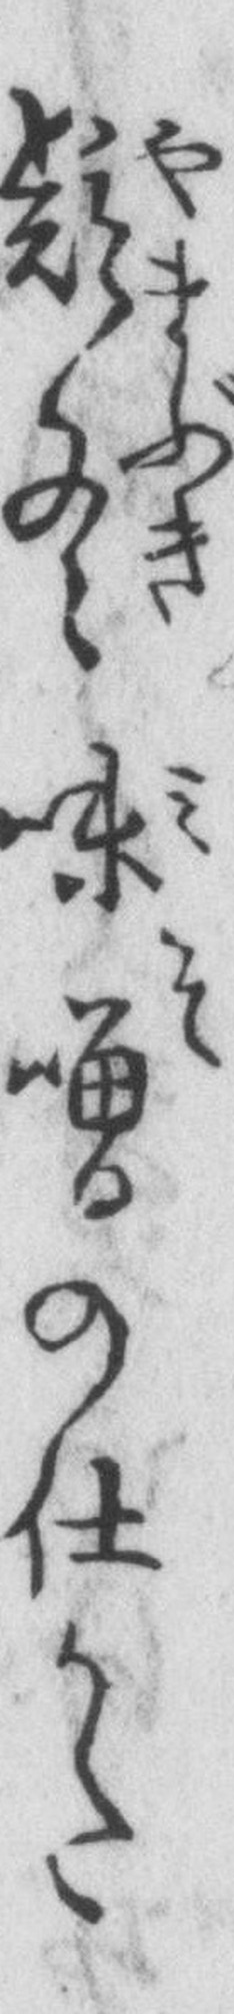款冬味噌の仕かた
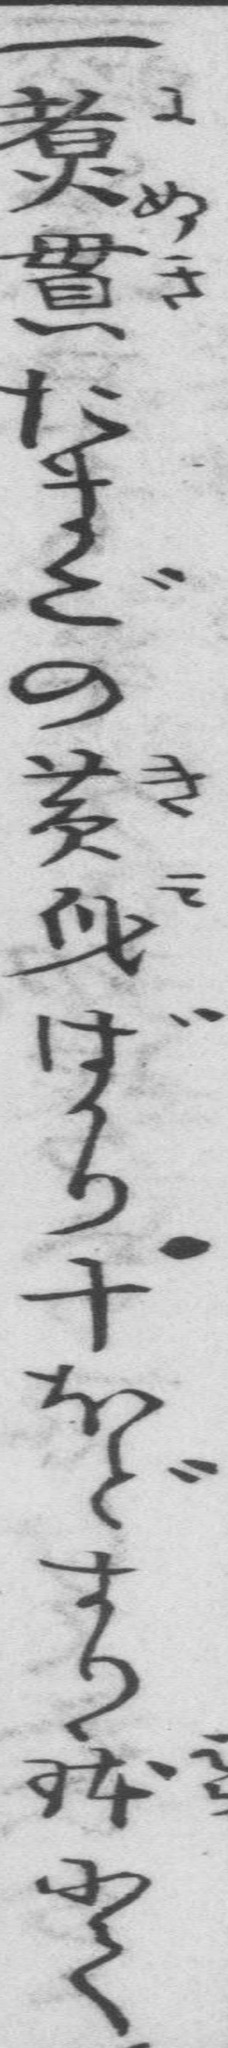一煮貫たまごの黄身ばかり。十ほどすり鉢にて
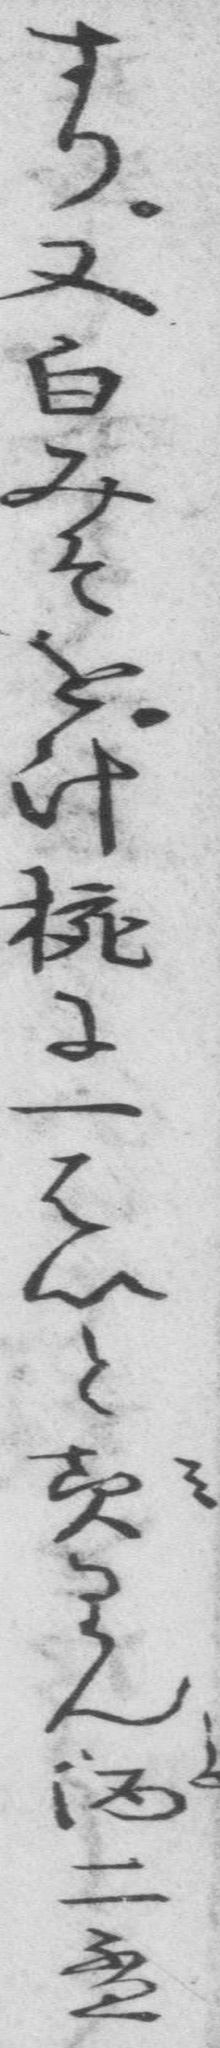すり。又白みそを。汁椀に一はいと美りん酒二盃
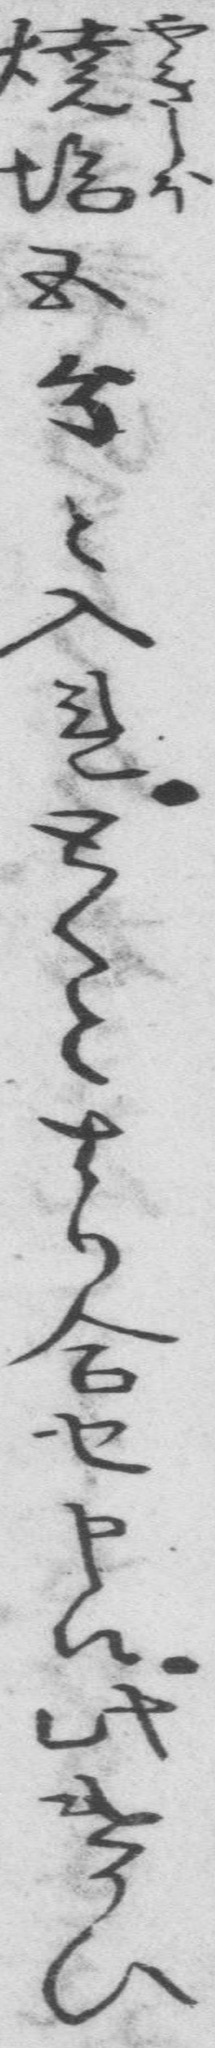焼塩五分と入れ。とくとすり合せ申候。此遣かひ
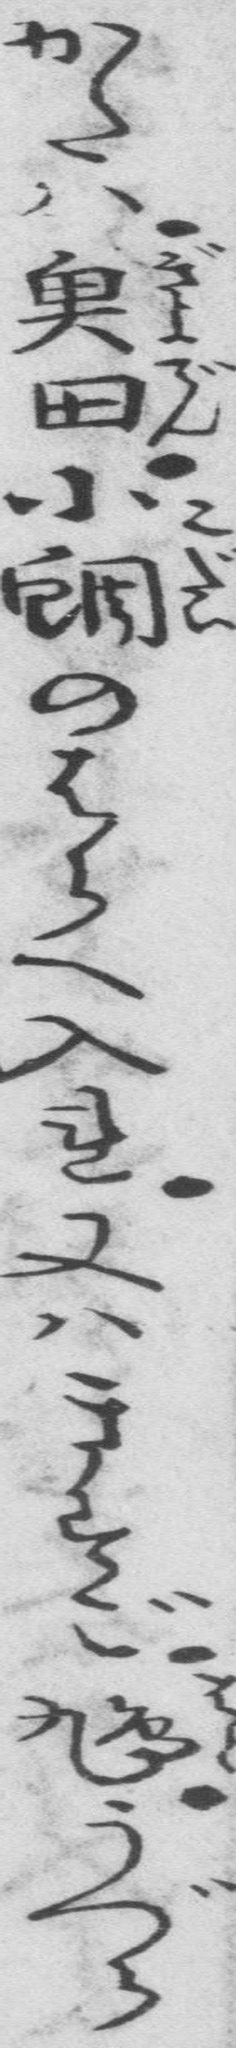かたは。魚田。小鯛のはらへ入れ。又はきすご。鳩。うづら
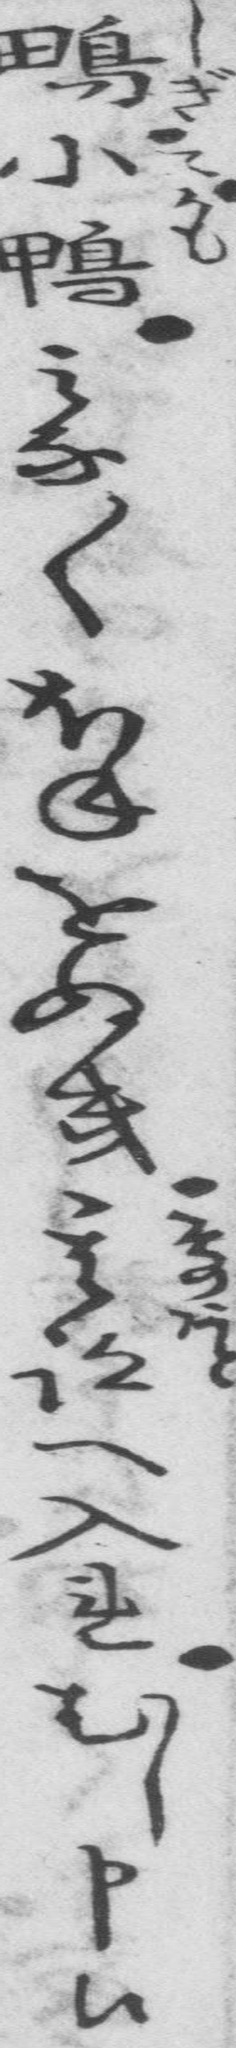鴫。小鴨。みな〳〵ほねをぬき。其跡へ入れ。むし申候
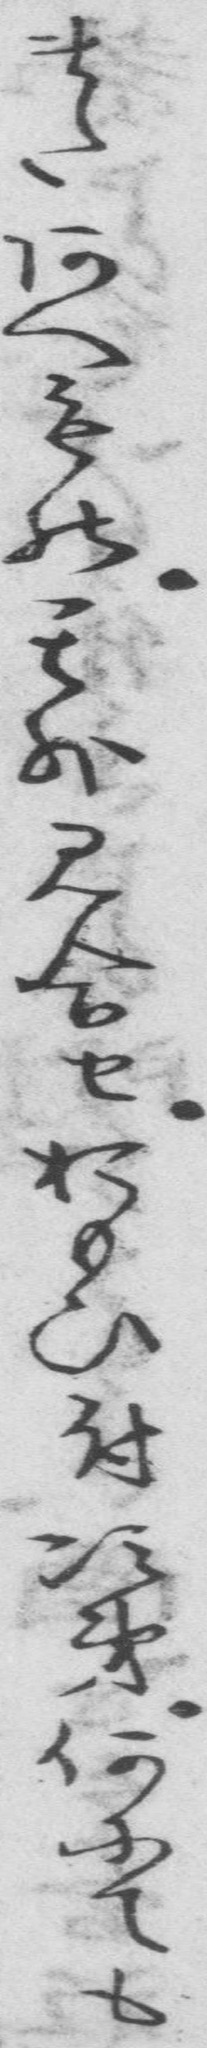またあへもの。其外見合せ。おもひ付次第。何にても
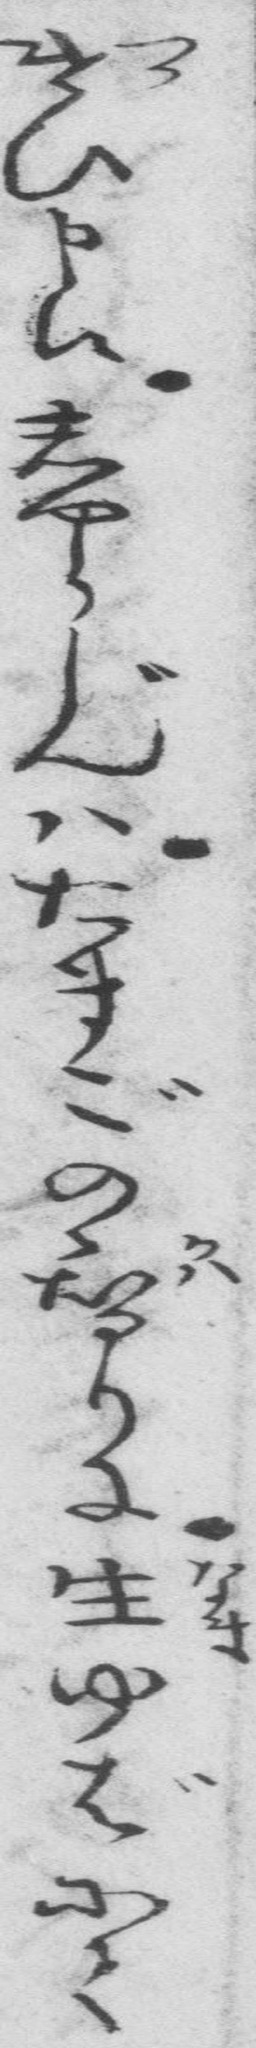遣ひ申候。しやうじんは、たまごの替りに。生ゆばにて
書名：萬寳料理秘密箱
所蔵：大阪府立大学学術情報センター 国文学研究資料館
